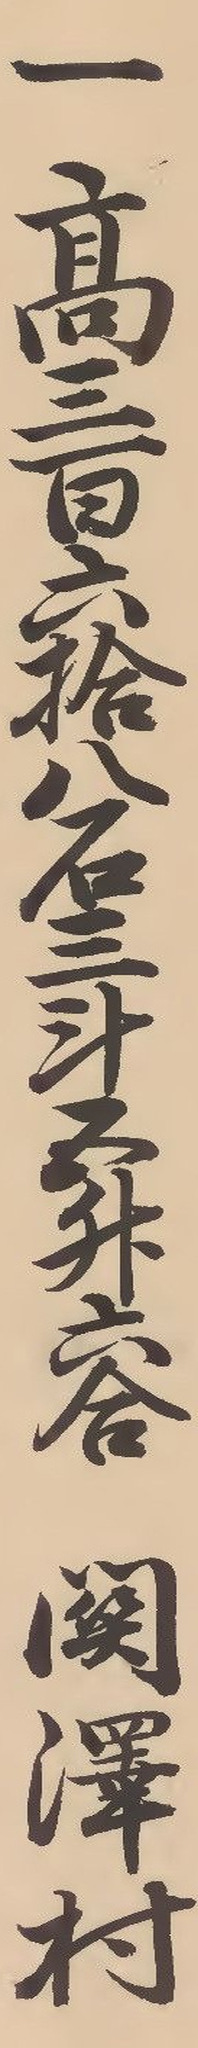一高三百六拾八石三斗五升六合関沢村
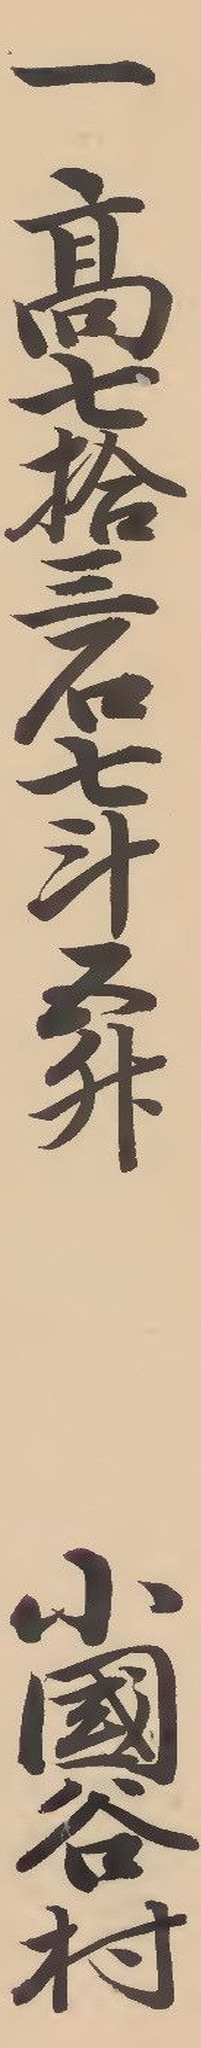一高七拾三石七斗五升小国谷村
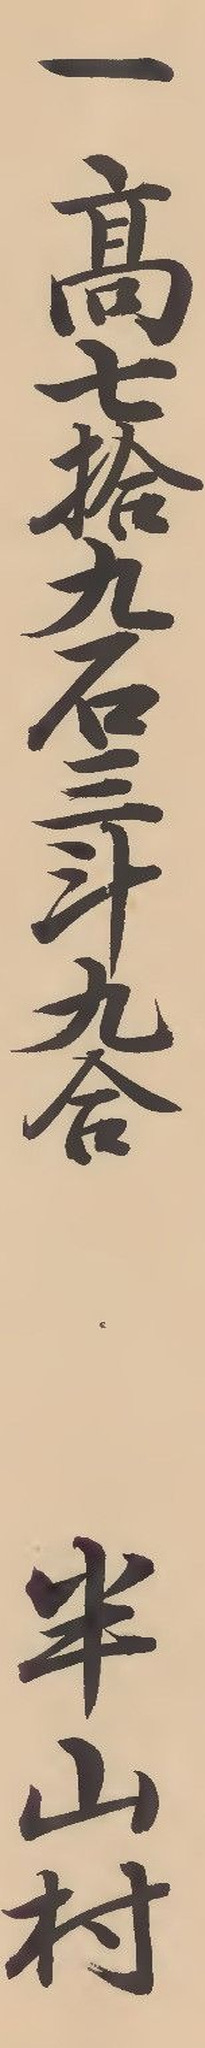一高七拾九石三斗九合半山村
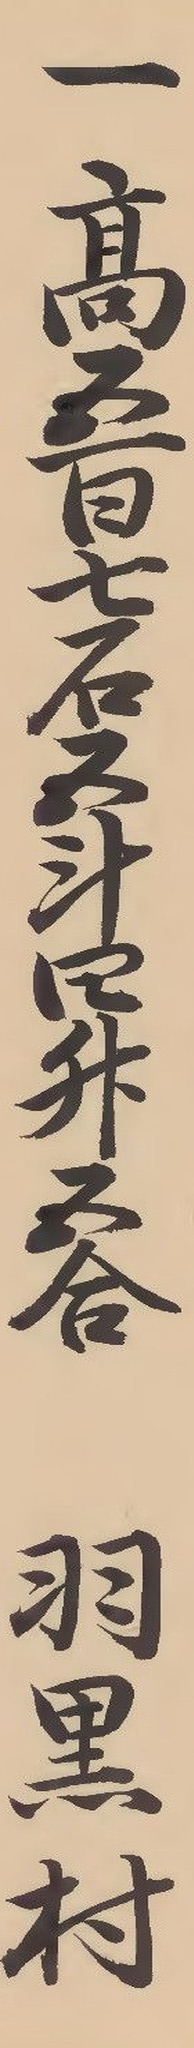一高五百七石五斗四升五合羽黒村
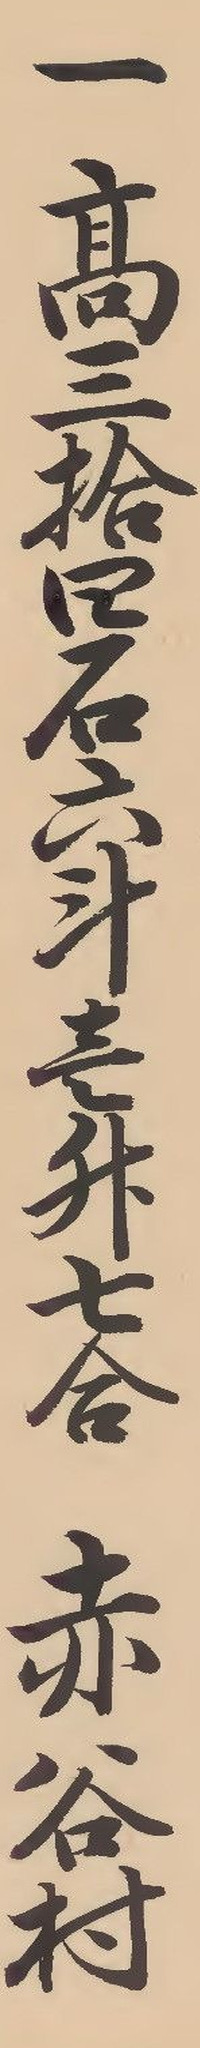一高三拾四石六斗壱升七合赤谷村

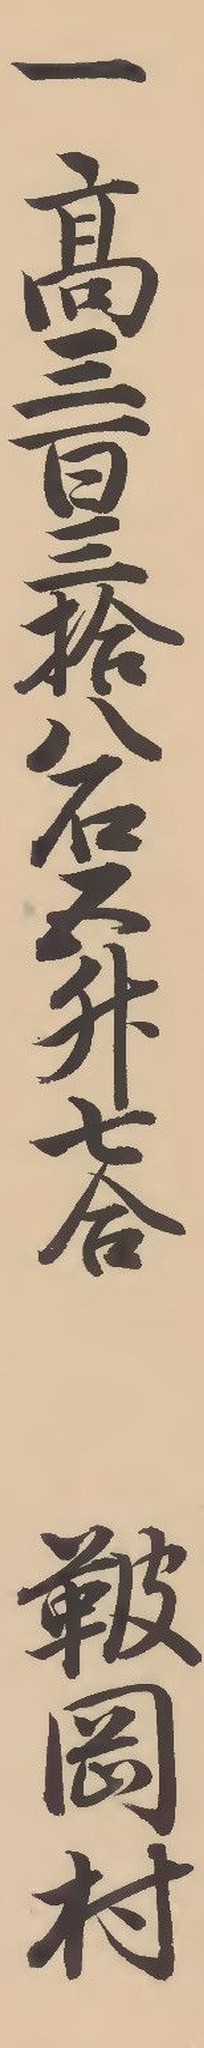一高三百三拾八石五升七合鞁岡村
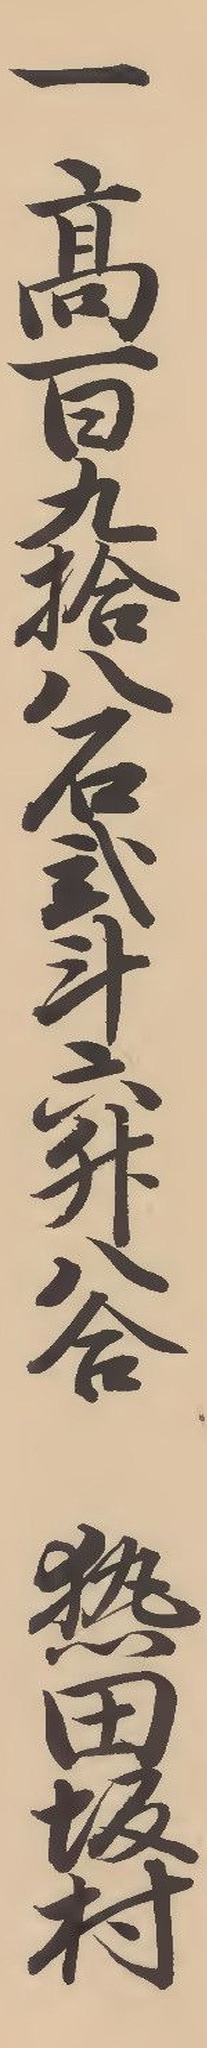一高百九拾八石弐斗六升八合熱田坂村
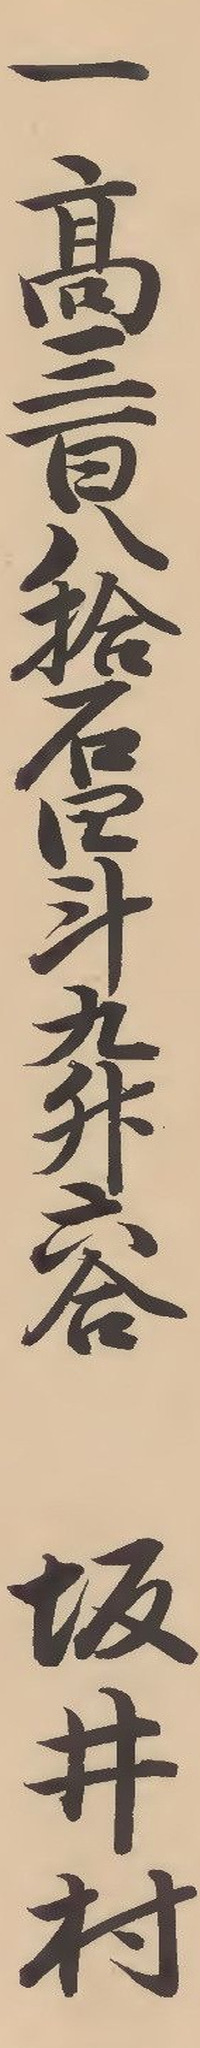一高三百八拾石四斗九升六合坂井村
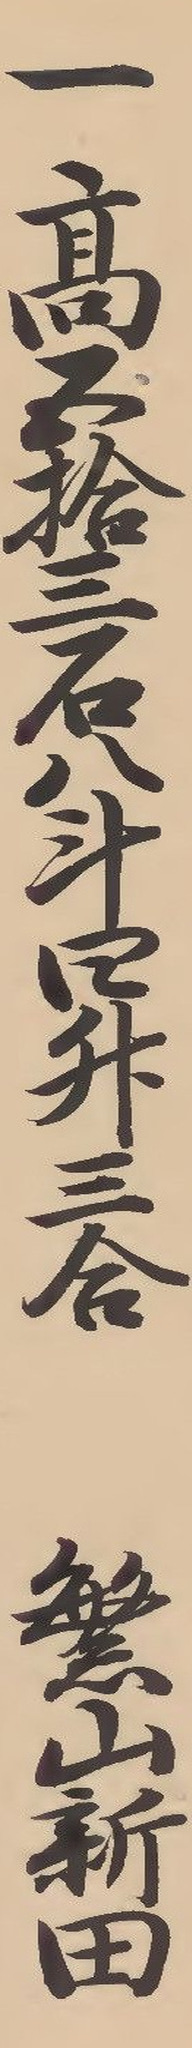一高五拾三石八斗四升三合繁山新田
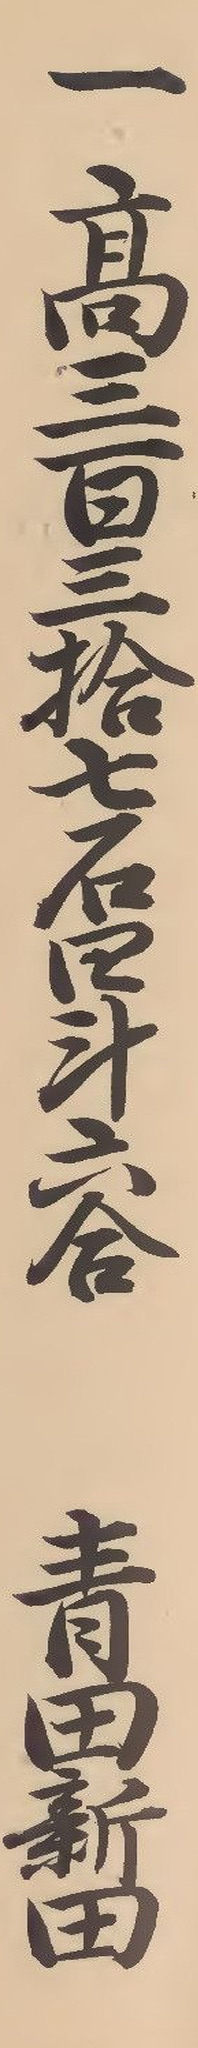一高三百三拾七石四斗六合青田新田
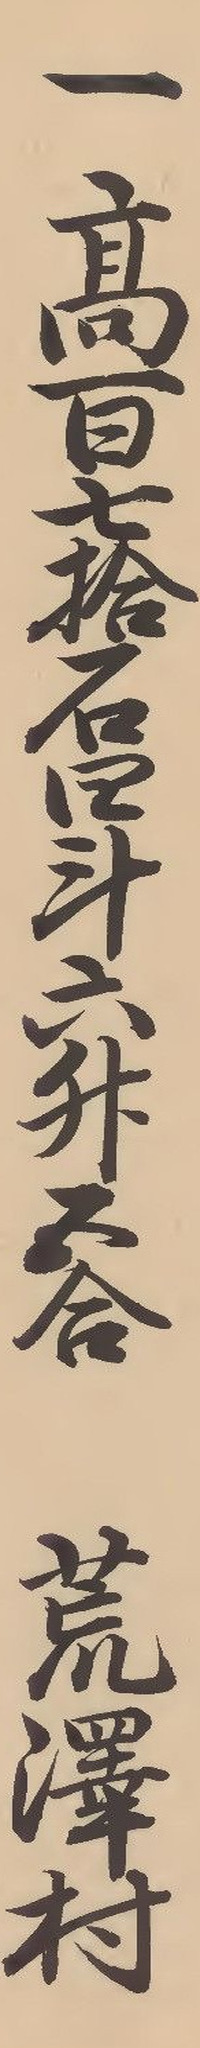一高百七拾石四斗六升五合荒沢村
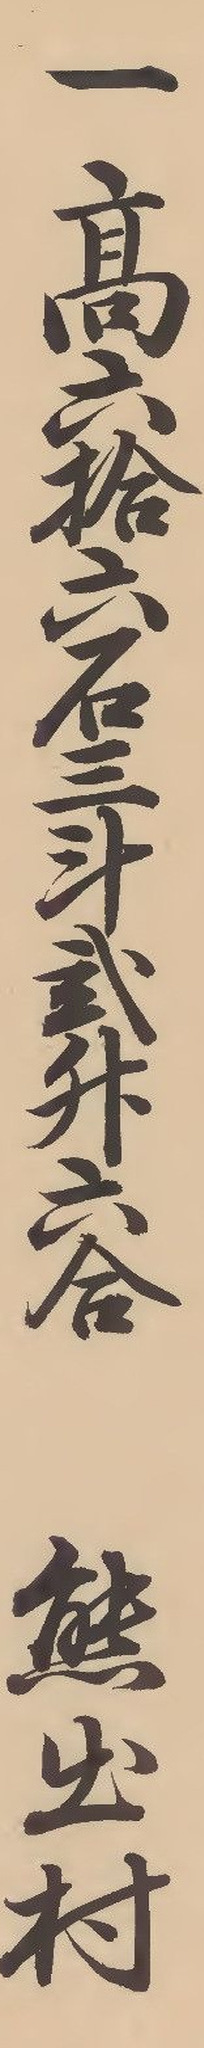一高六拾六石三斗弐升六合熊出村
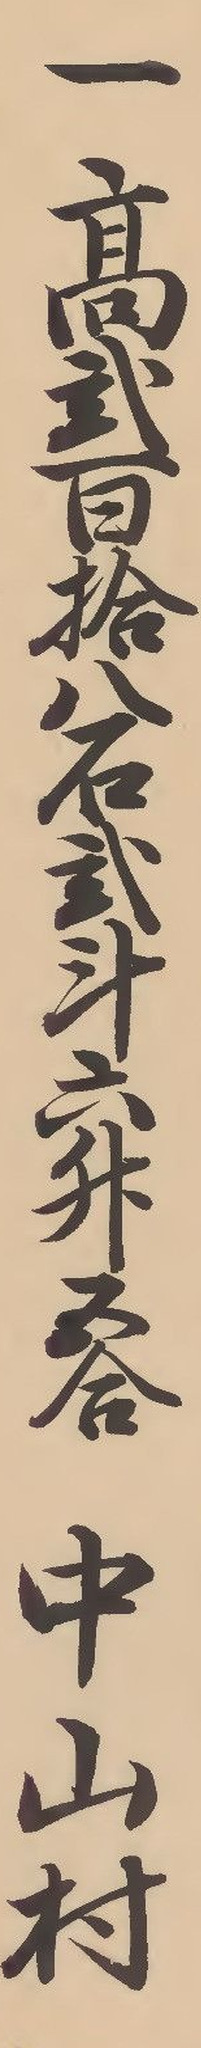一高弐百拾八石弐斗六升五合中山村

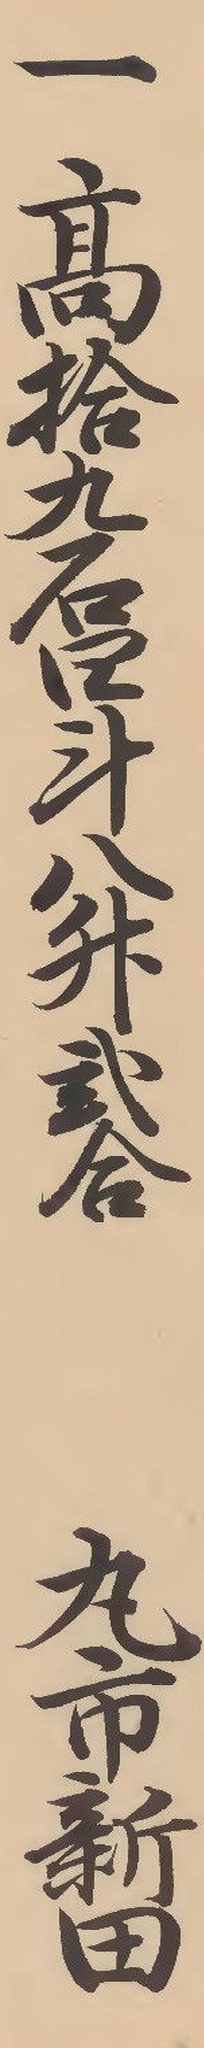一高拾九石四斗八升弐合丸市新田
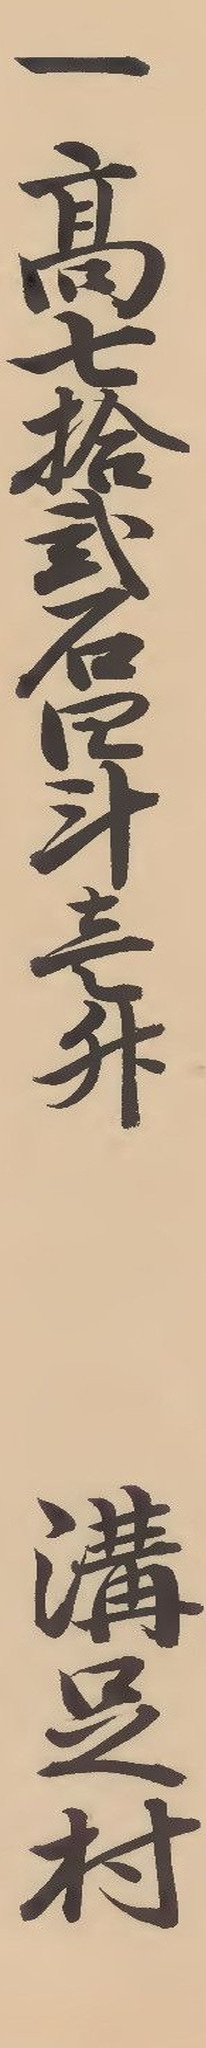一高七拾弐石四斗壱升溝足村
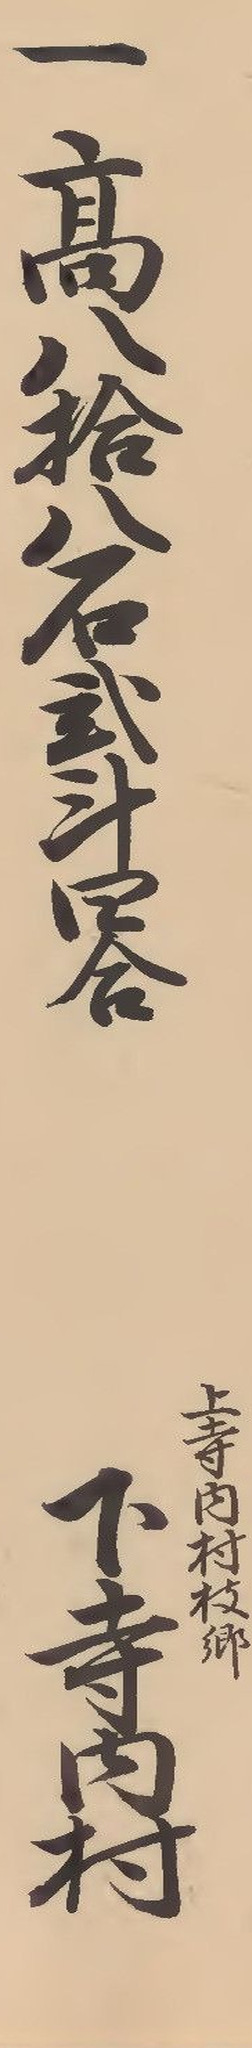一高八拾八石弐斗四合下寺内村
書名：越後国郷帳　下
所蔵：国立公文書館 National Archives of Japan
